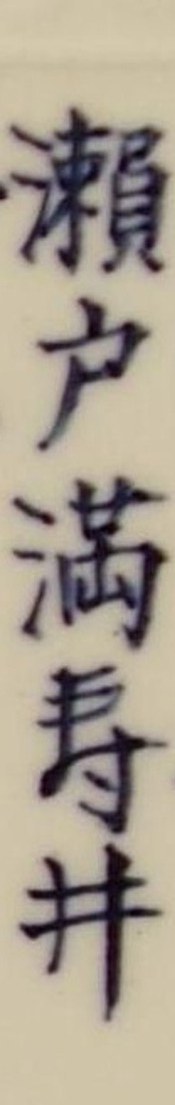瀬戸満寿井
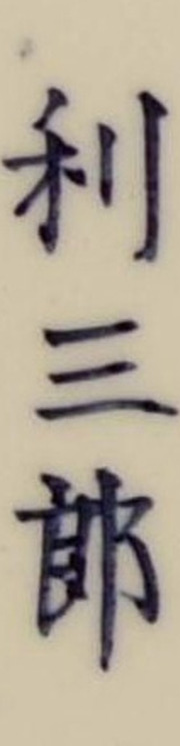利三郎
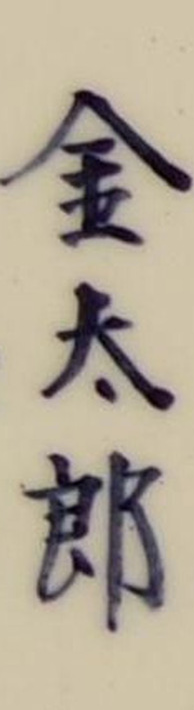金太郎

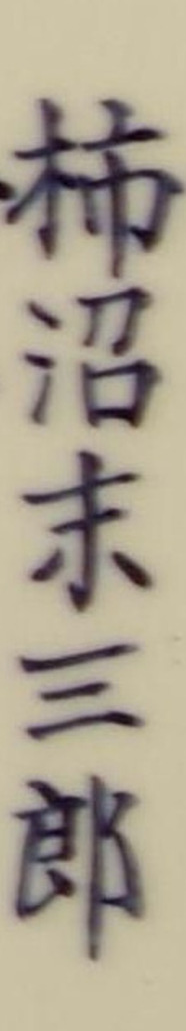柿沼末三郎
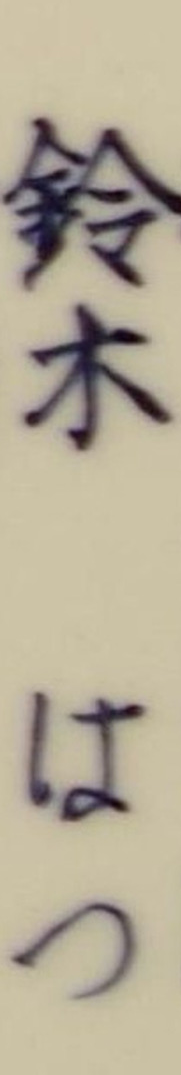鈴木はつ
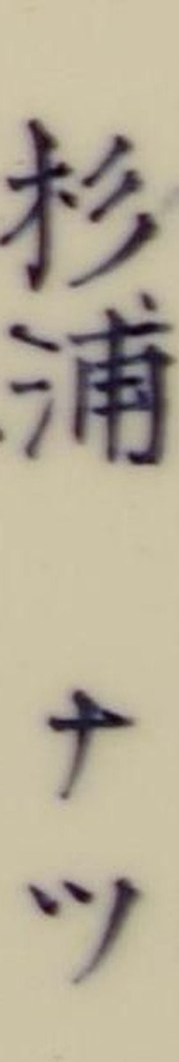杉浦ナツ
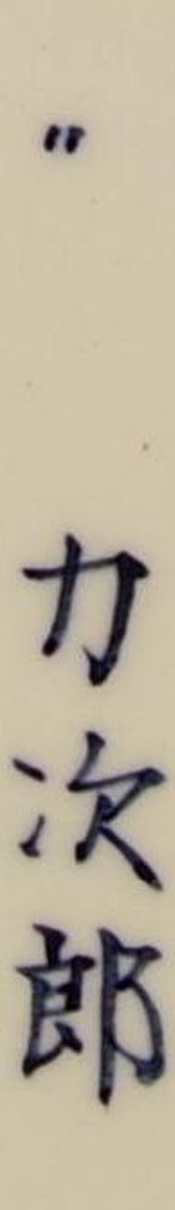力次郎
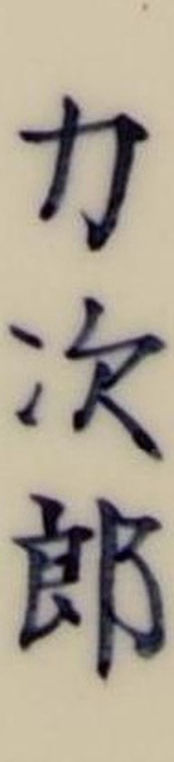力次郎
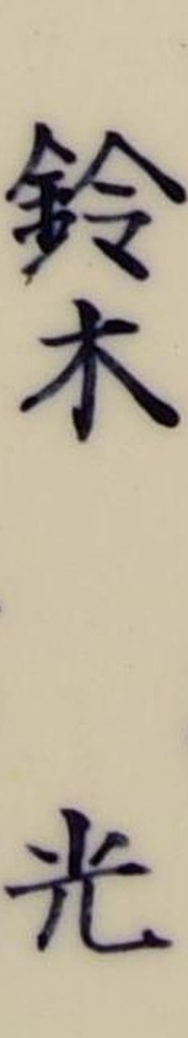鈴木光
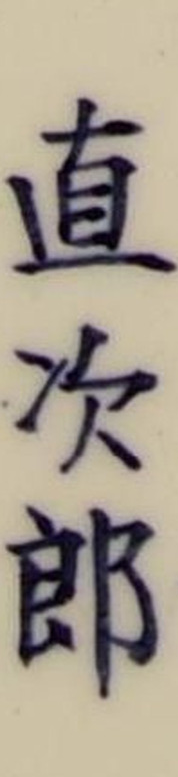直次郎
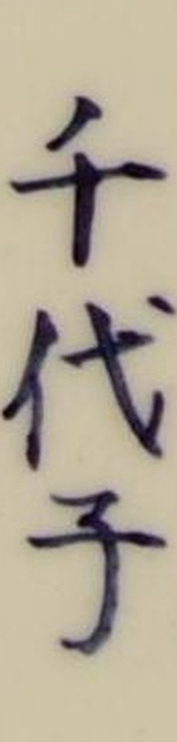千代子

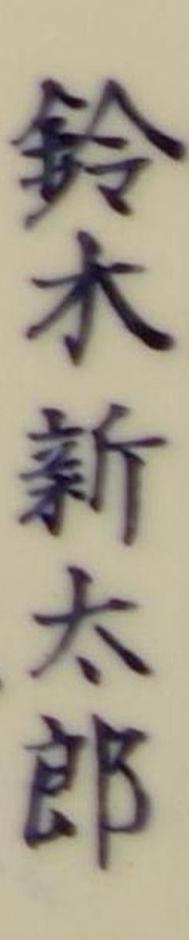鈴木新太郎
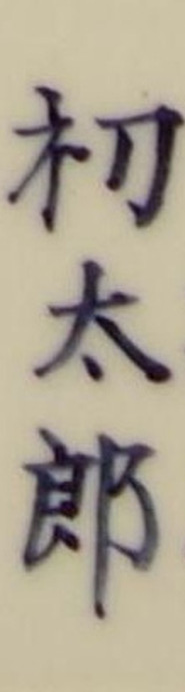初太郎
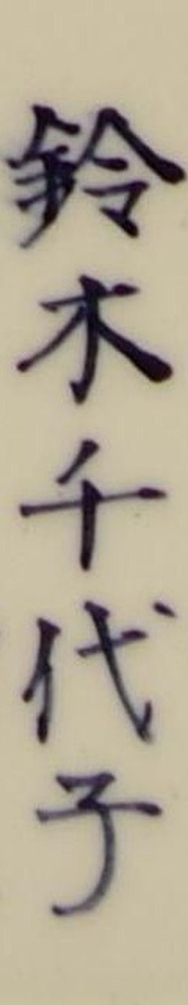鈴木千代子
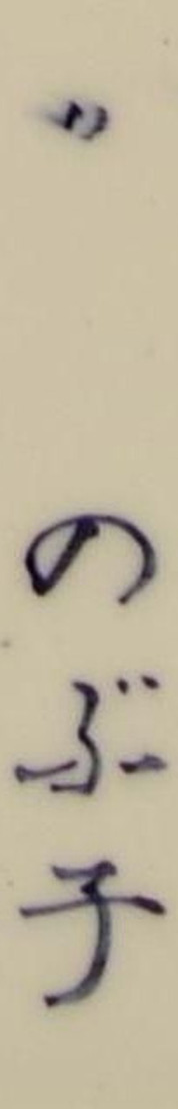のぶ子
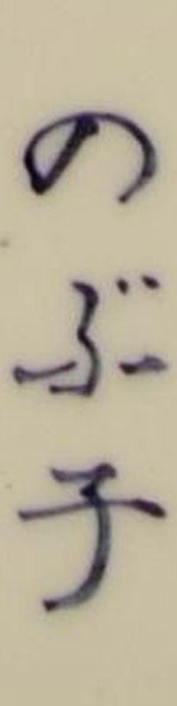のぶ子
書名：E~L
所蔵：高野山金剛峯寺
